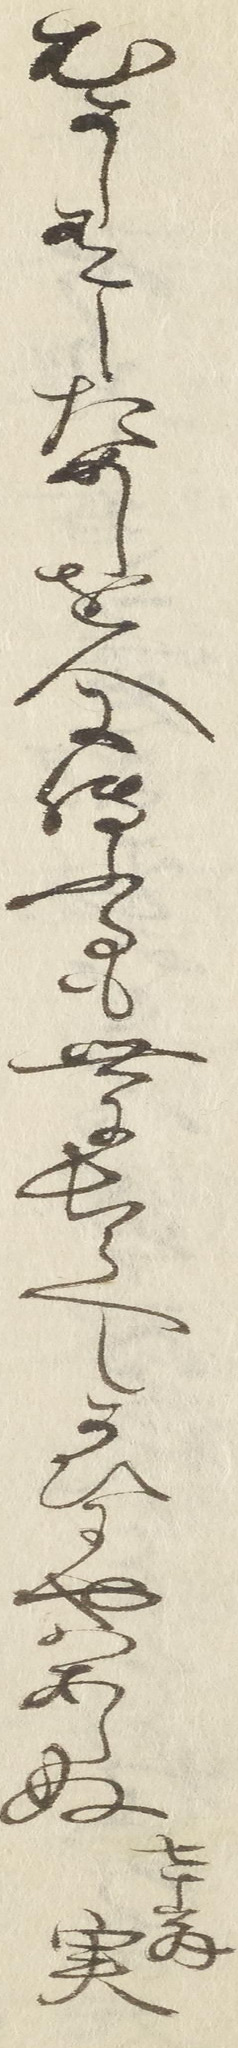むかし有しためしを人に伝ふるも世に長らへしかひにやはあらぬ実
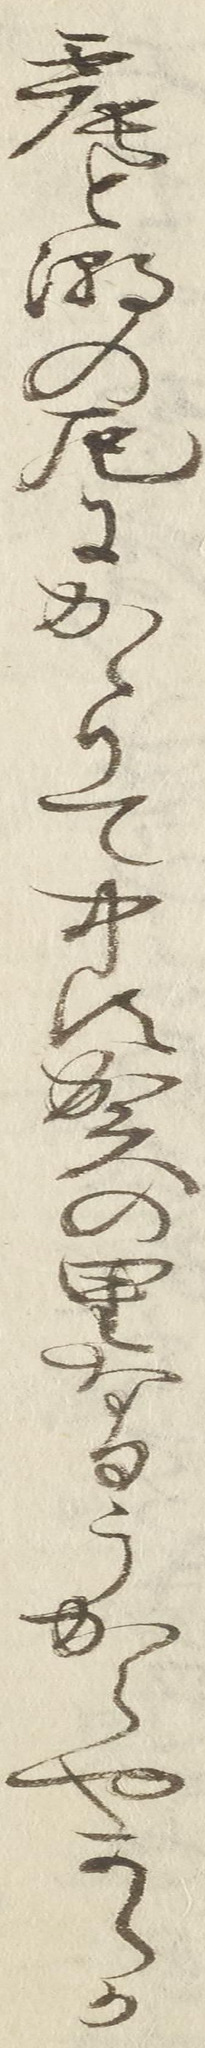震と潮の厄にかゝりて中す賀の里なるうからやからか
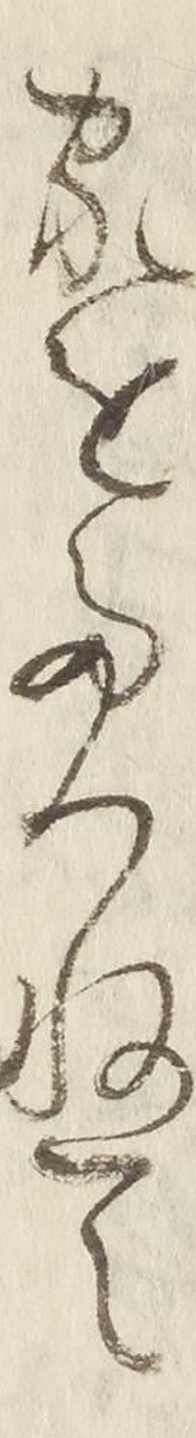家をたつねて同
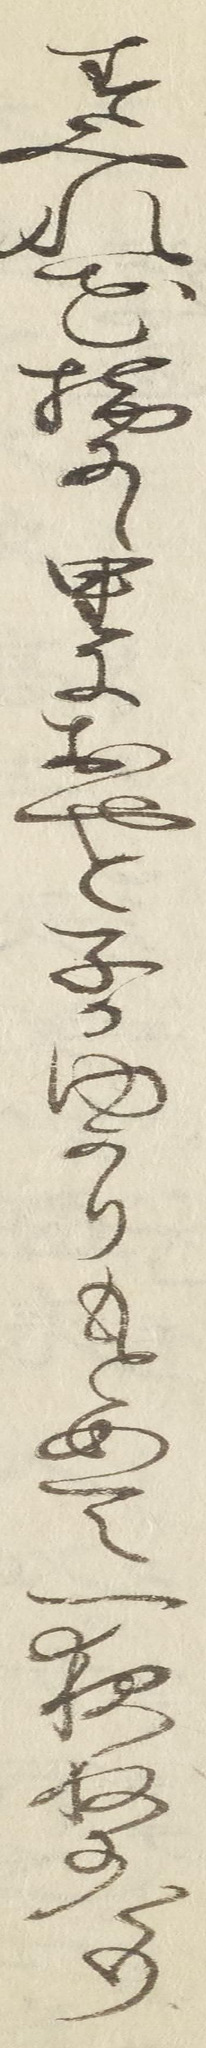すみれ花指にし里におやと子かゆかりもとめて一夜ねりけり
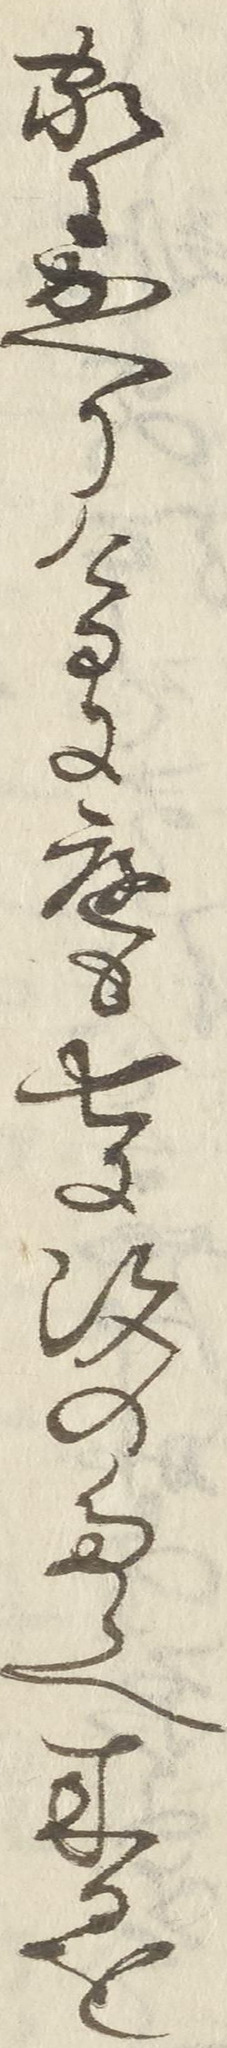家にかへりけるに庭も七に汐のたゝへ来るを
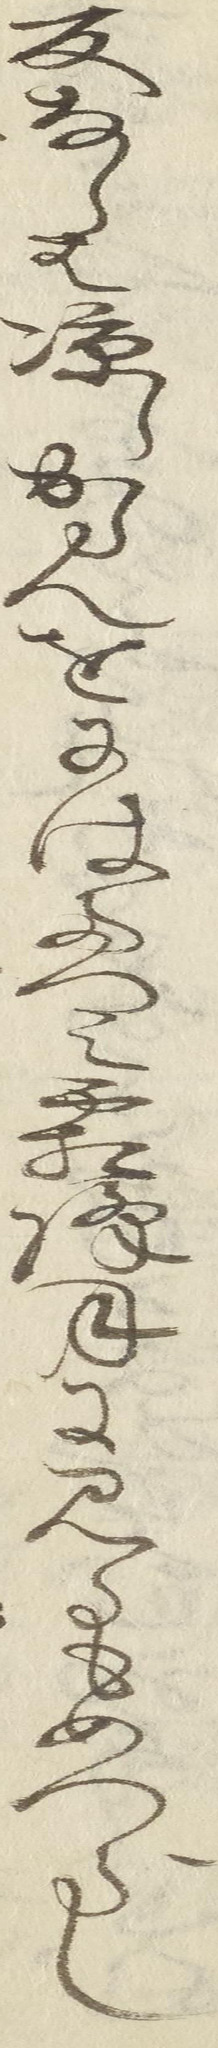夏ならは涼しからんをにはたつみ霜降月に見るもめつらし
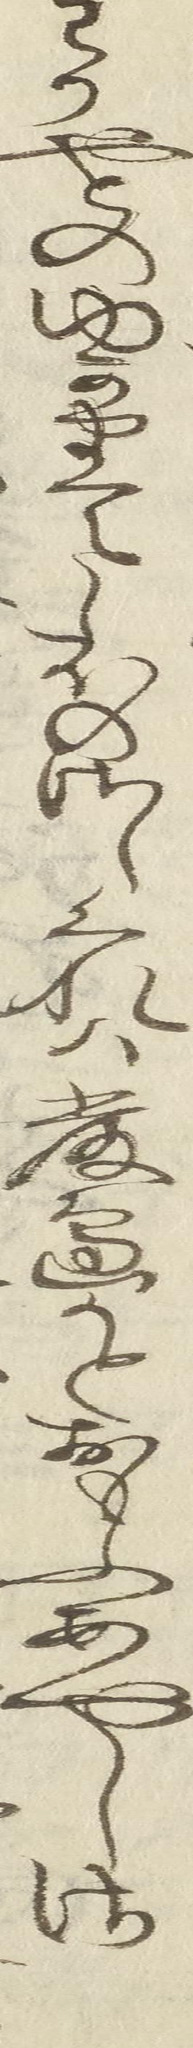わかやとのゆかりてしほのさしくれは厳嶋かとおもふあやしさ
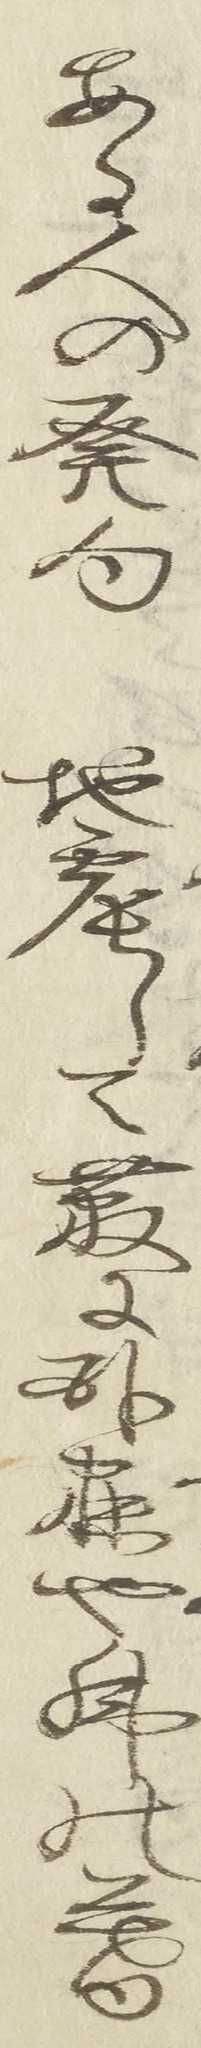ある人の発句地震して叢に臥寝や乕の暮

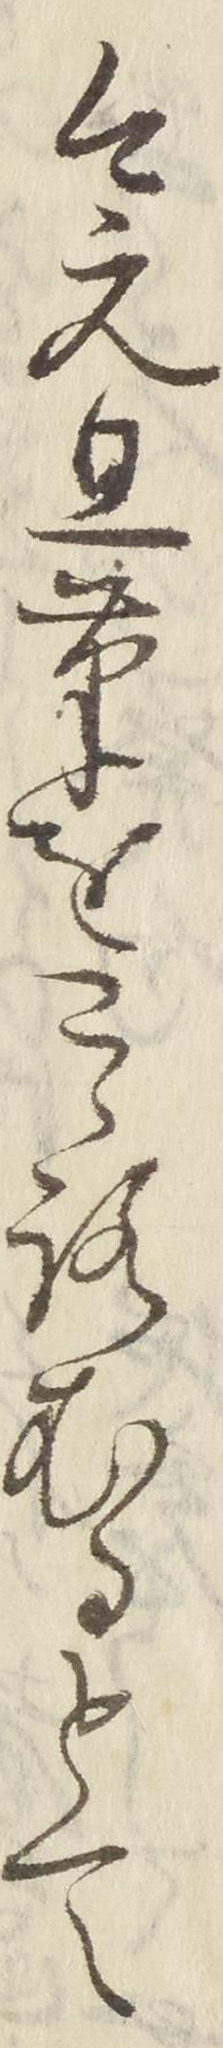今元旦筆をこゝろむるとて同
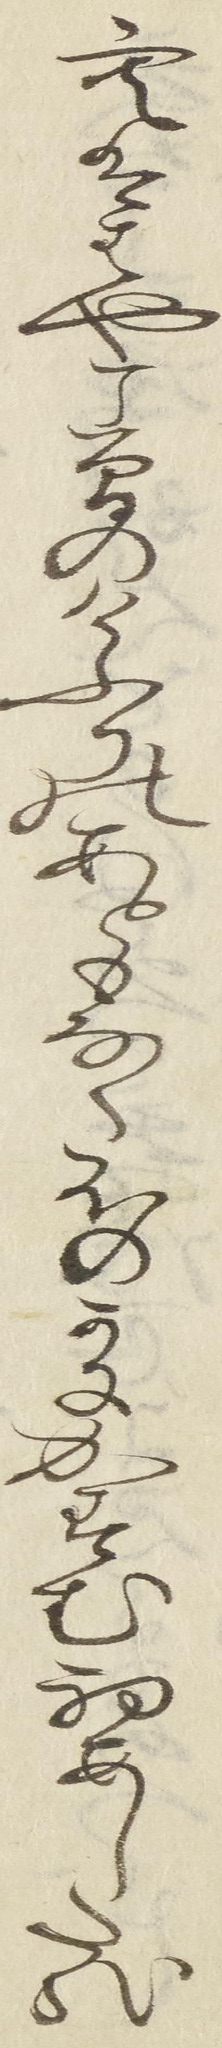空ははやこそのけふりのあともなくほのかにかすむ初あした哉
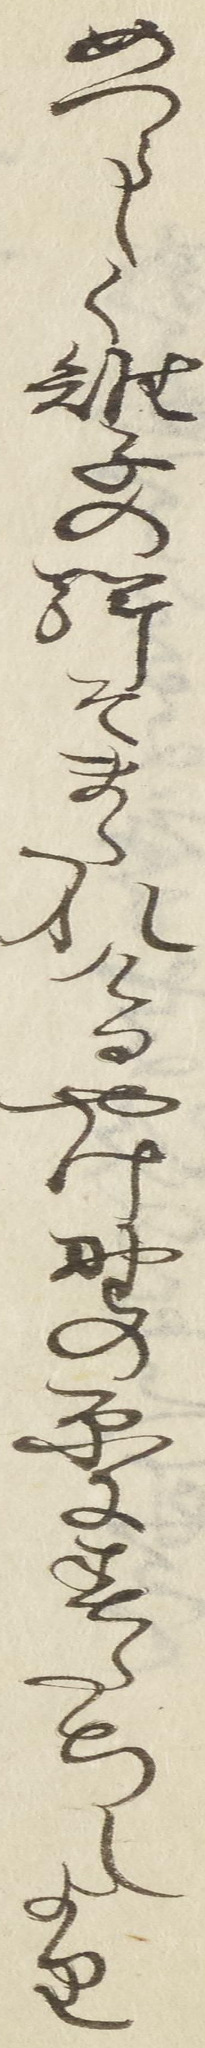めつらしく雉子の群そまたれけるやけ野の原にすたちしより
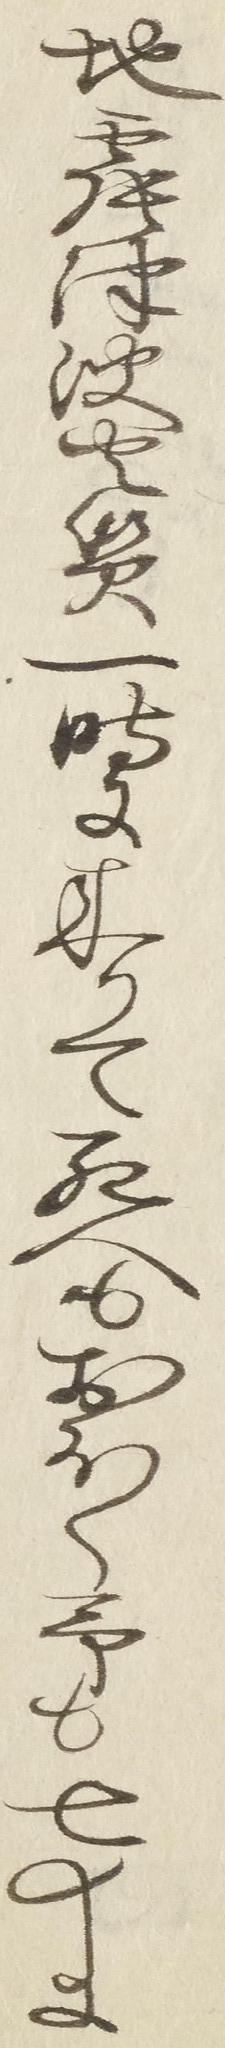地震津波火災一時に来りて死人もおほく予も七十に
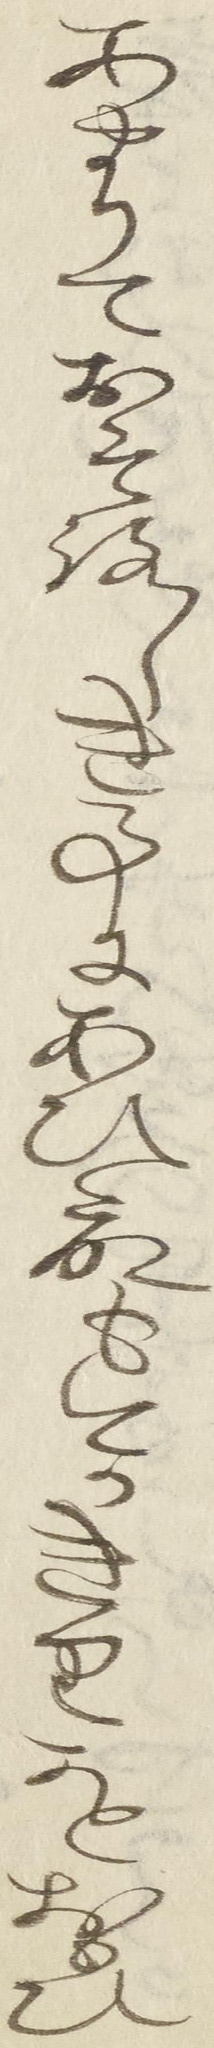あまりておそろしき事にあひ死もてつきりかとおもひ
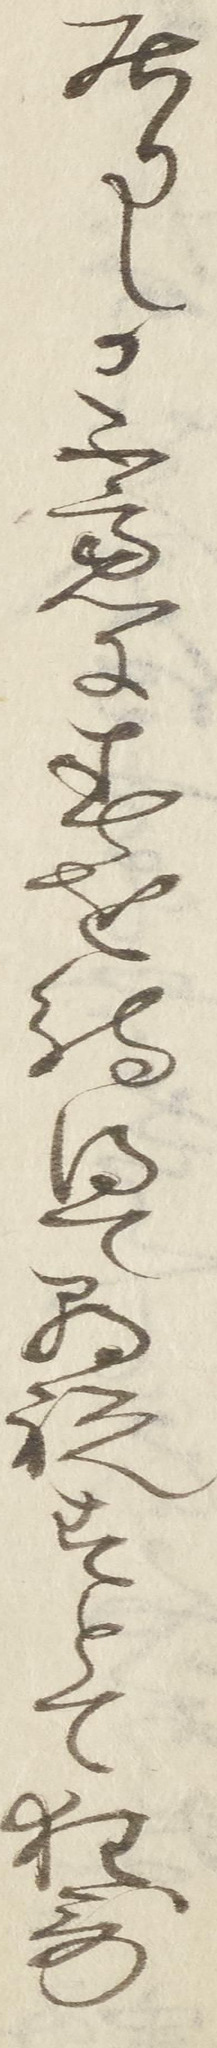居りしか不慮に春を待得て朝祝すとて狂歌
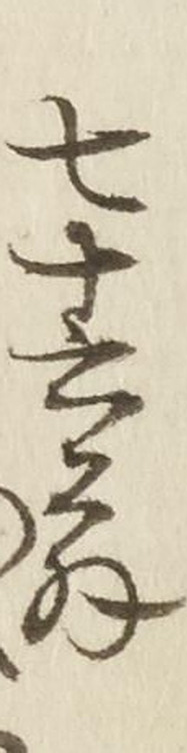七十六翁
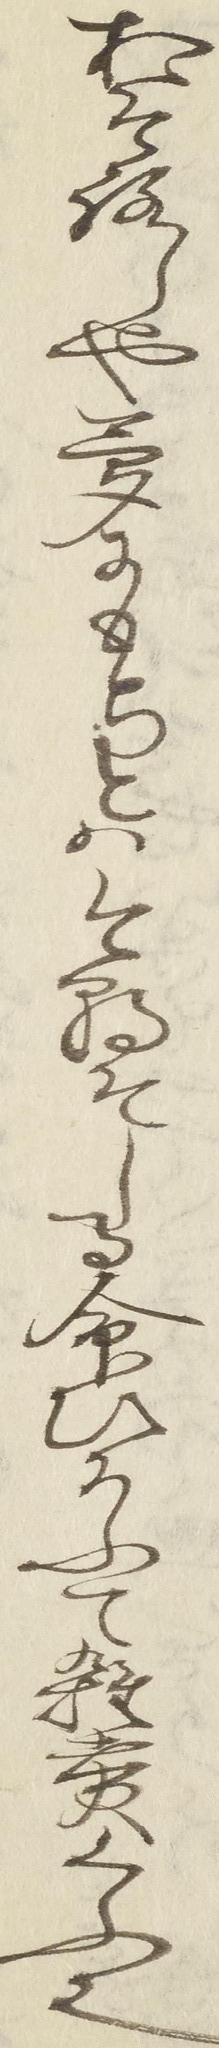おそろしや夢にもちとは今朝そしる命ひろふて雑煮くふ也
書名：地震記　下
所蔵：東京大学地震研究所図書室 Earthquake Research Institute Library, The University of Tokyo, JAPAN
